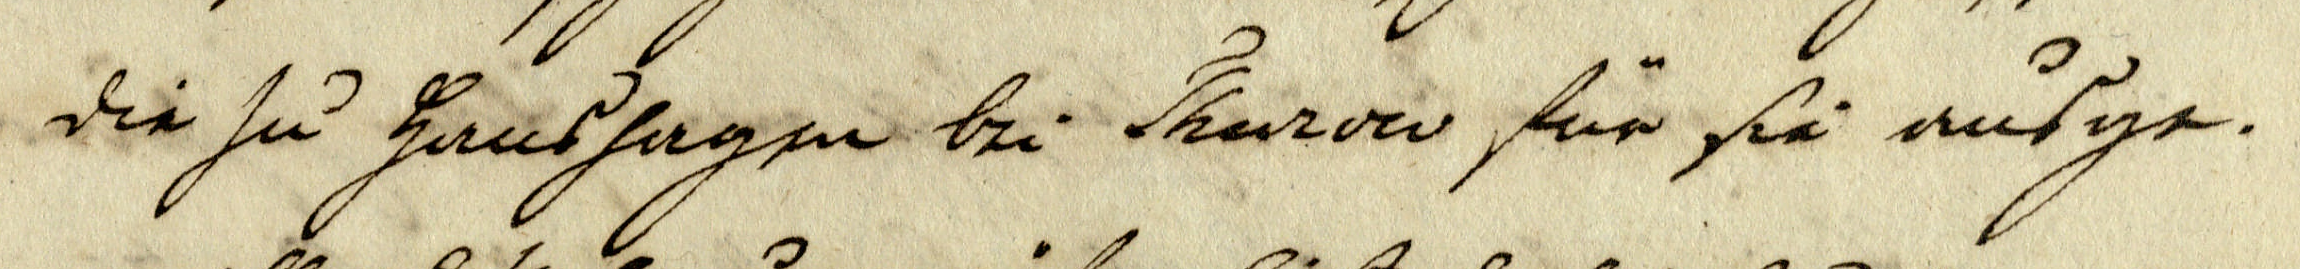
die zu Hanshagen bei Thurow für sie ausge¬
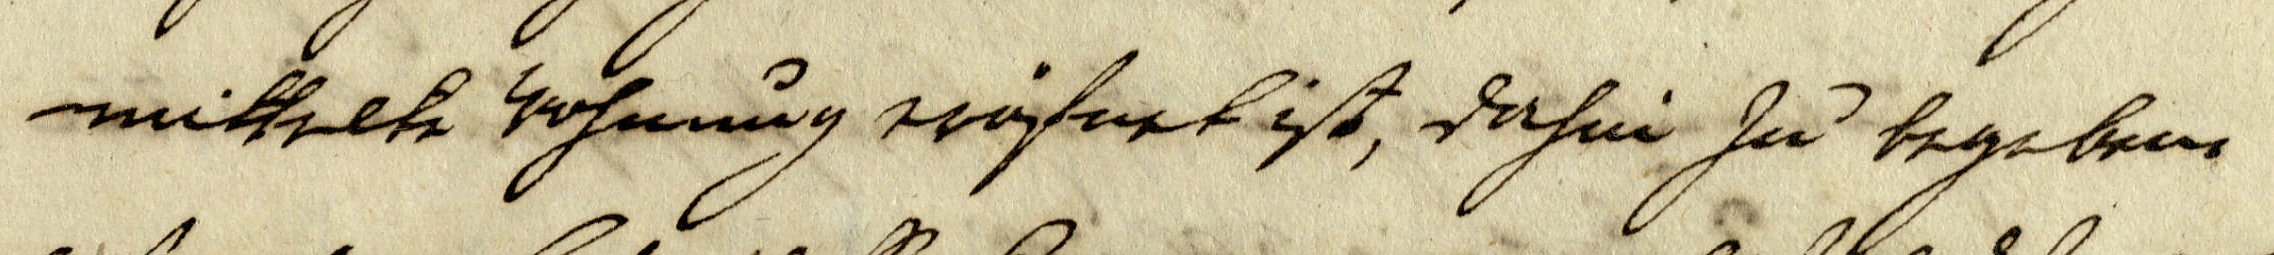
mittelte Wohnung eröfnet ist, dahin zu begeben.
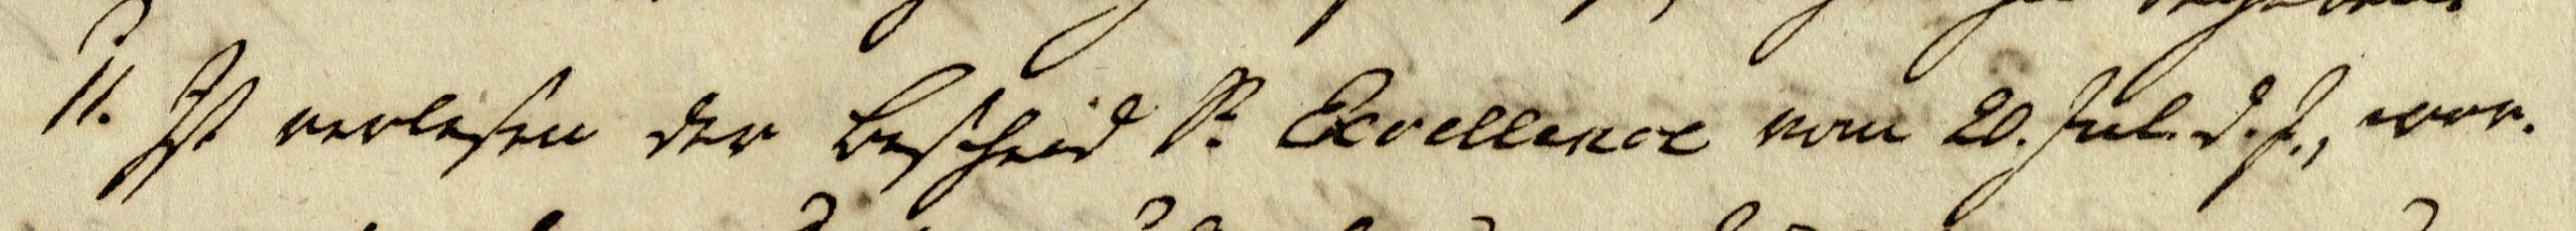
11. Ist verlesen der Bescheid Sr Excellence vom 20. Jul. d. J., wor¬
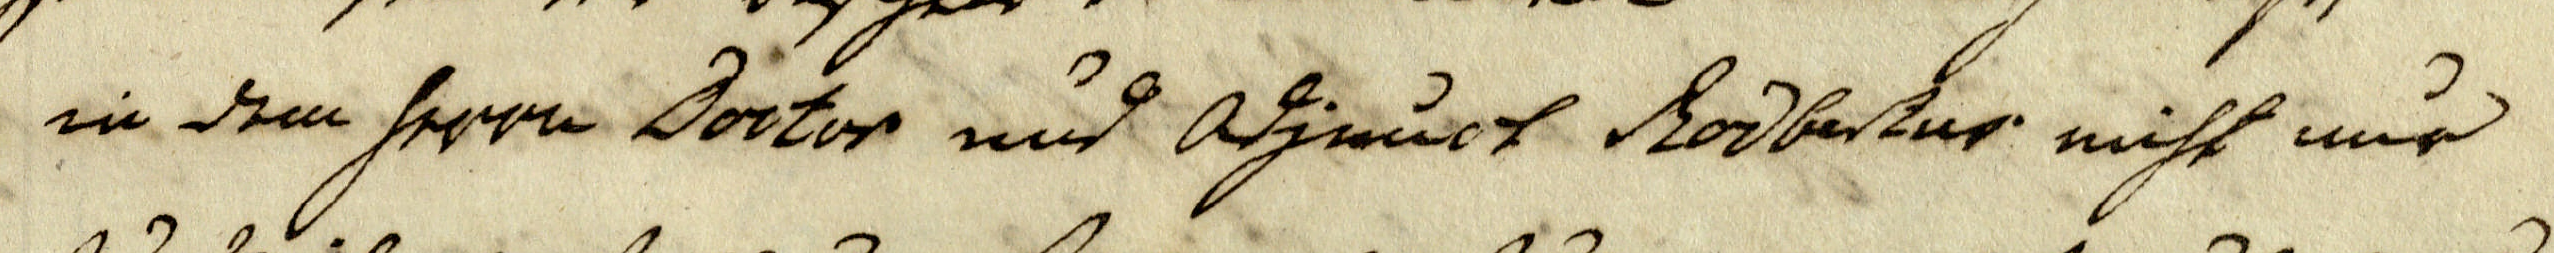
in dem Herrn Doctor und Adjunct Rodbertus nicht nur
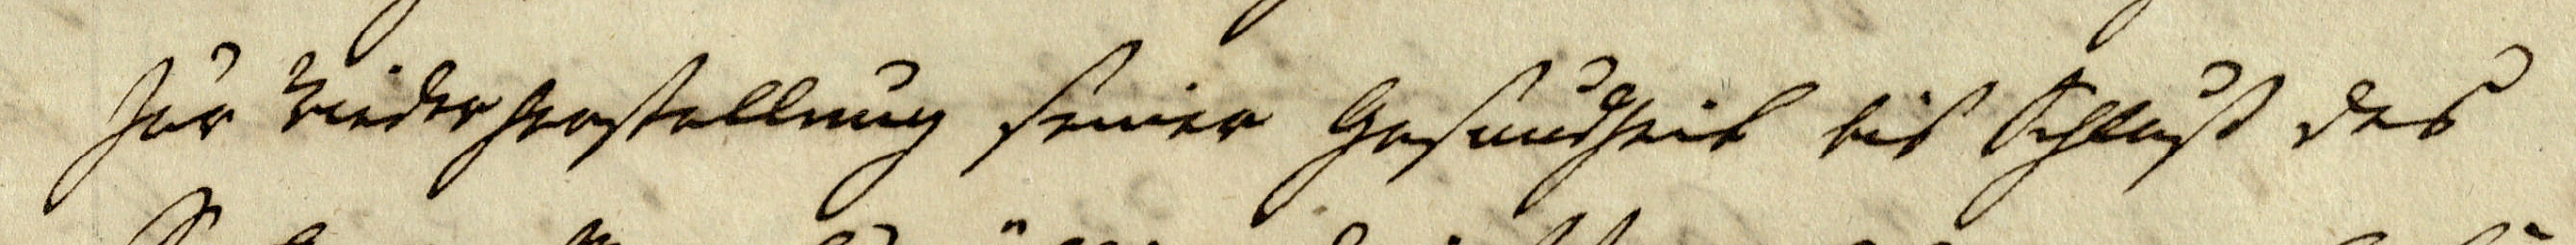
zur Wiederherstellung seiner Gesundheit bis Schluß des
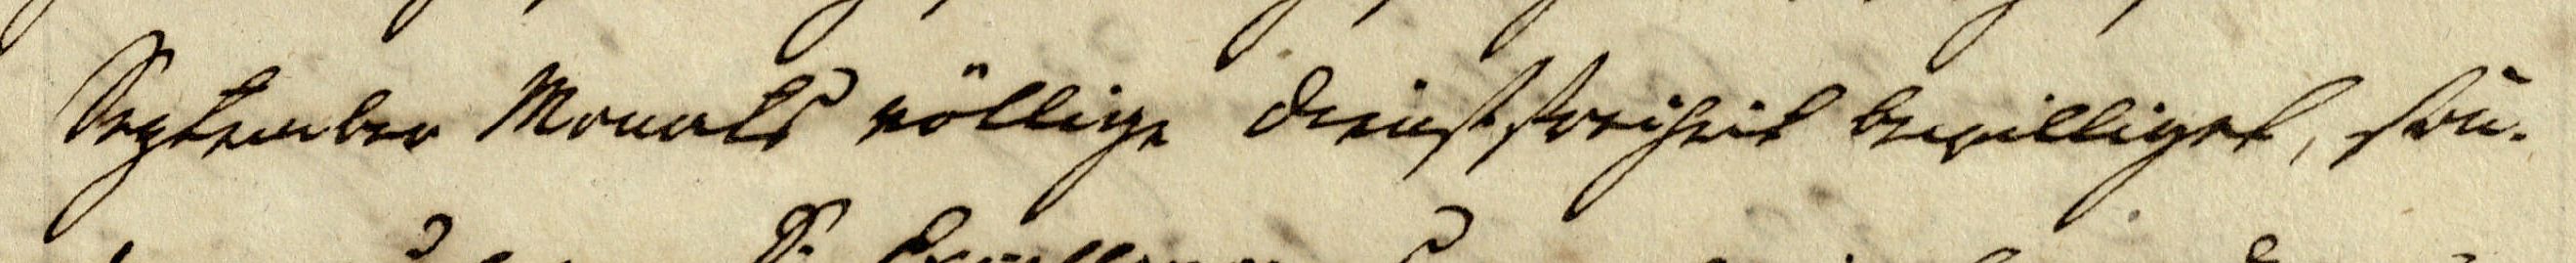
September Monats völlige Dienstfreiheit bewilliget, son¬
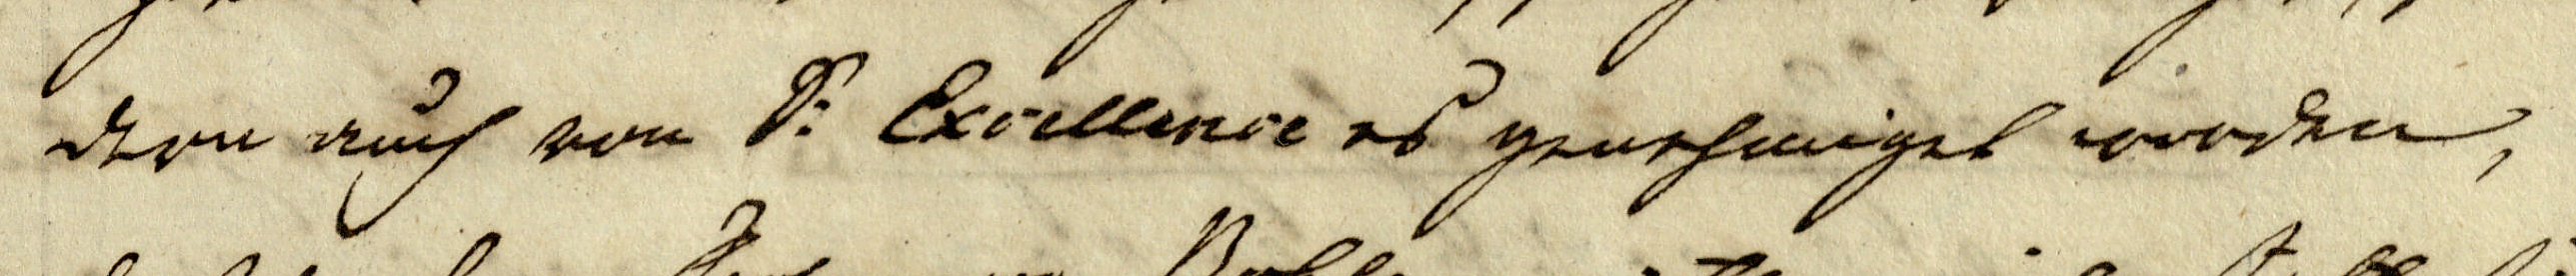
dern auch von Sr Excellence es genehmiget werden,
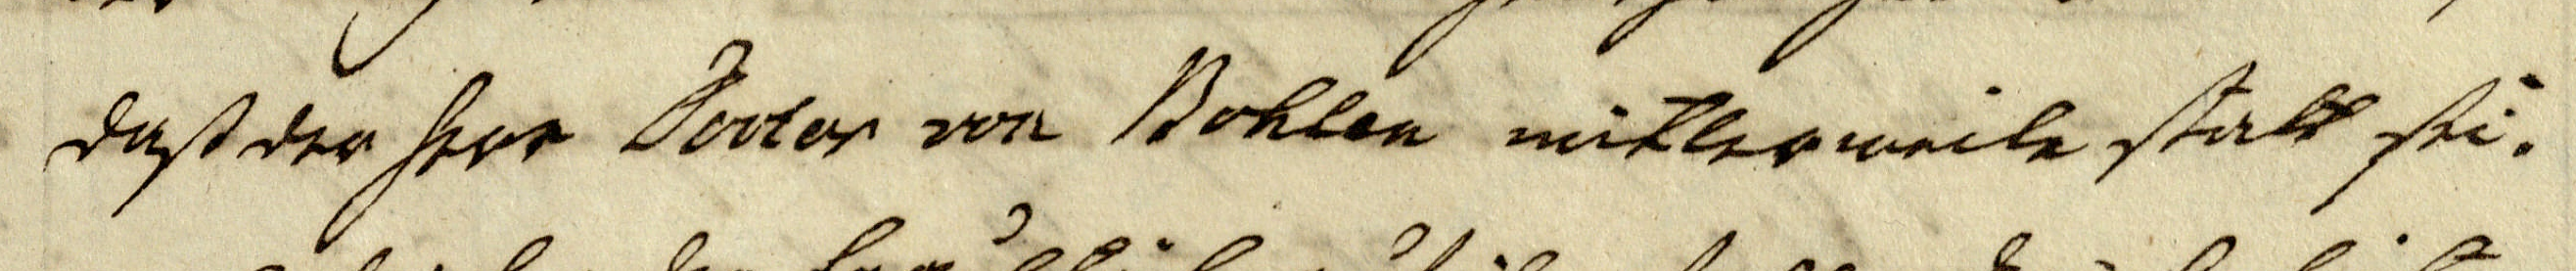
daß der Herr Doctor von Bohlen mitlerweile statt sei¬
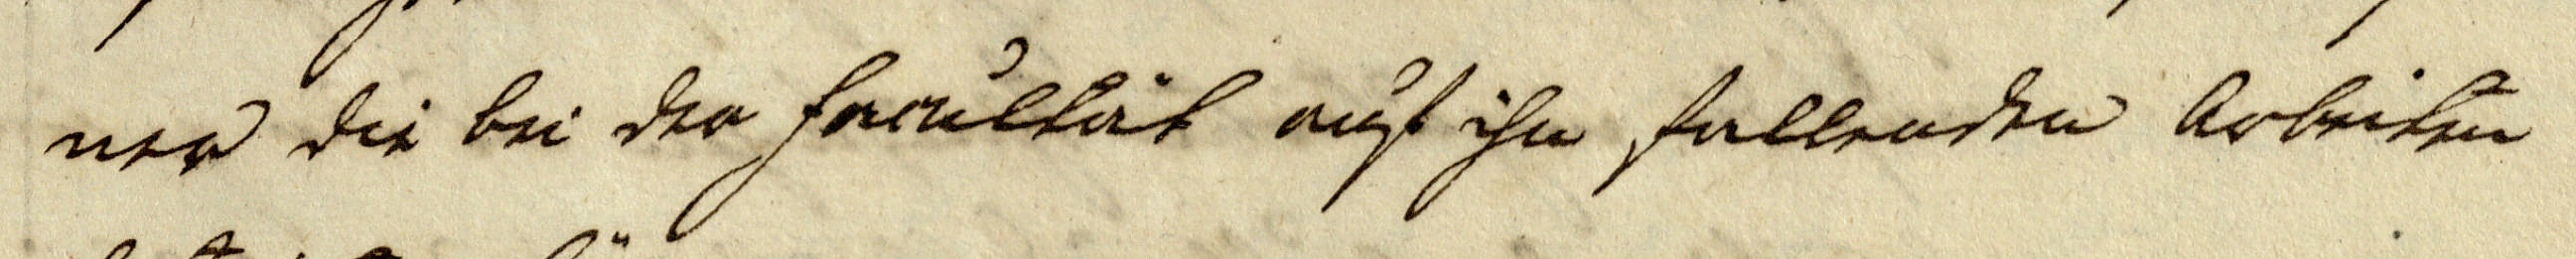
ner die bei der Facultät auf ihn fallenden Arbeiten
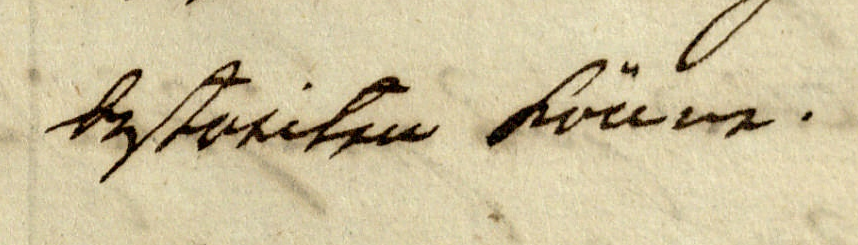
bestreiten könne.
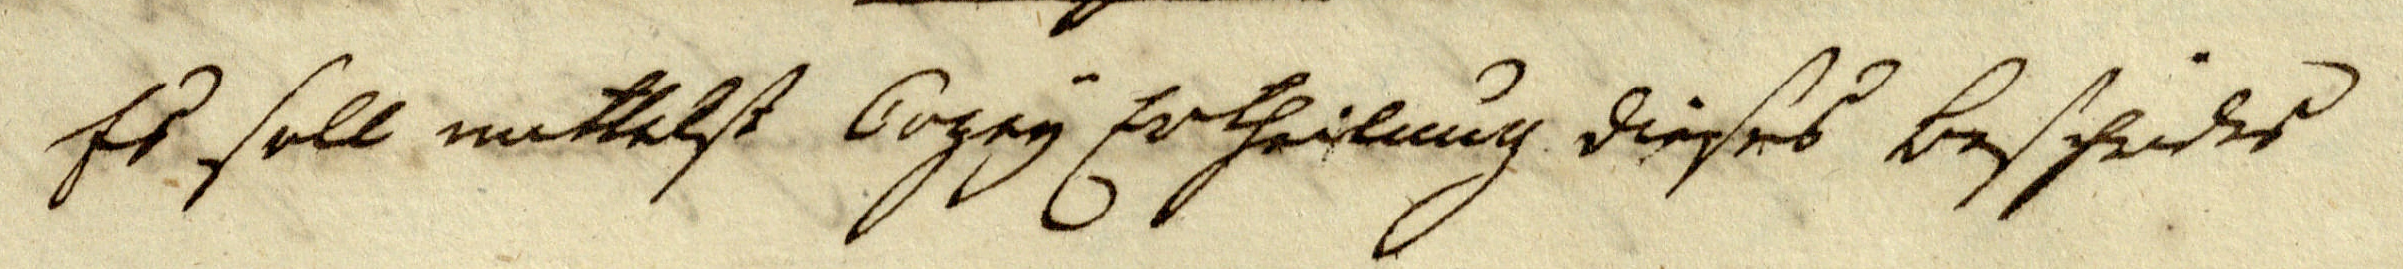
Es soll mittelst Copeÿ Ertheilung dieses Bescheides
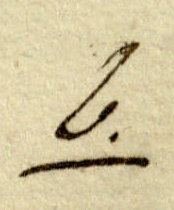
2.
